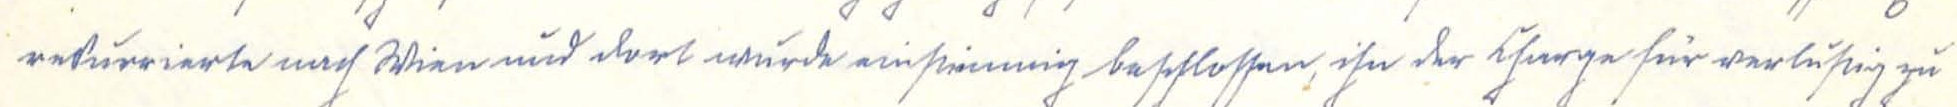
rekursierte nach WIen und dort wurde einstimmig beschlossen, ihn der Charge für verlustig zu
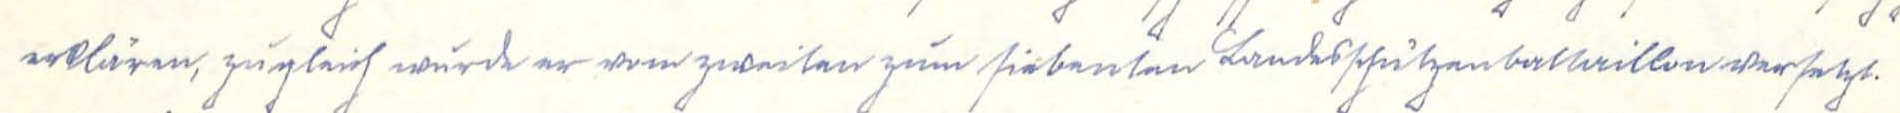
erklären, zugleich wurde er vom zweiten zum siebenten Landesschützenbataillon versetzt.
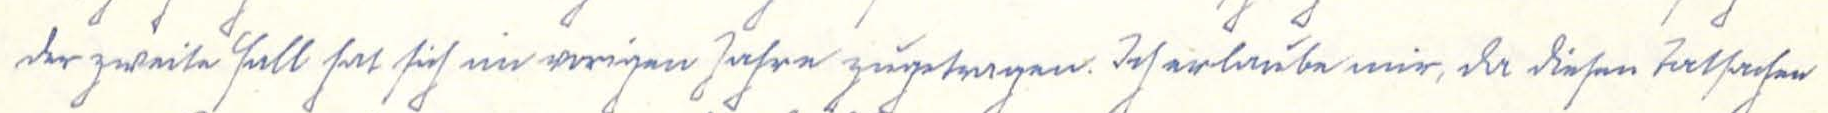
Der zweite Fall hat sich im vorigen Jahre zugetragen . Ich erlaube mit, da diese Tatsache
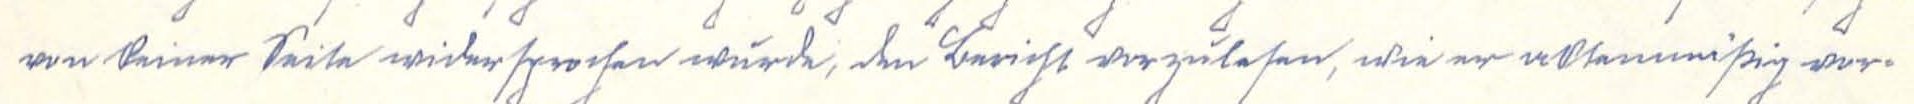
von keiner Seite wiedersprochen wurde, den Bericht vorzulesen, wie er aktenmäßig vor-
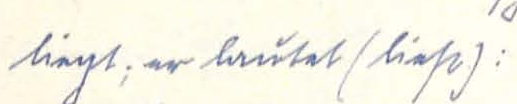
liegt; er lautet (ließt):
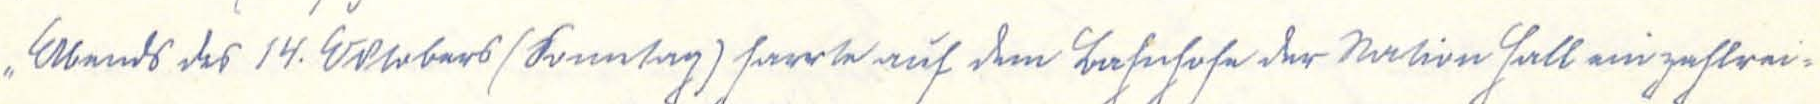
"Abends des 14. Oktobers (Sonntag) harrte auf dem Bahnhof der Station Hall ein zahlreic-
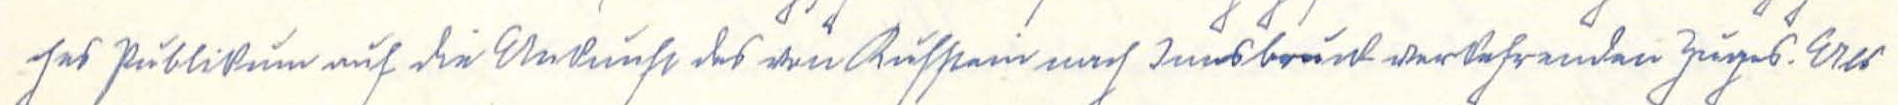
hes Publikum auf die Ankunft das von Kufstein nach Innsbruck verkehrenden Zuges. Als
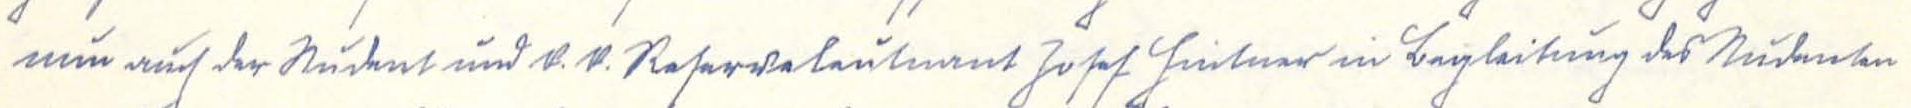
nun auch der Student und k.k. Reserveleutnant Josef Hintner in Begleitung des Studenten
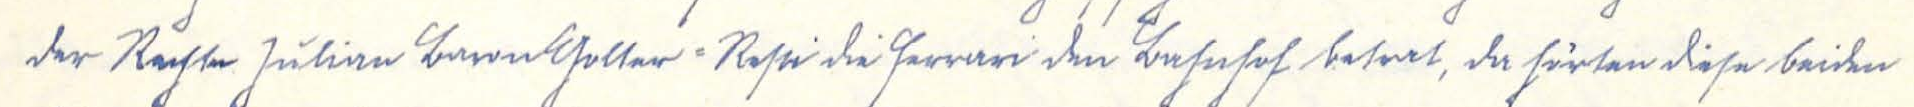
der Rechte Julian Baron Golter-Resti di Ferrari den Bahnhof betrat, da hörten diese beiden
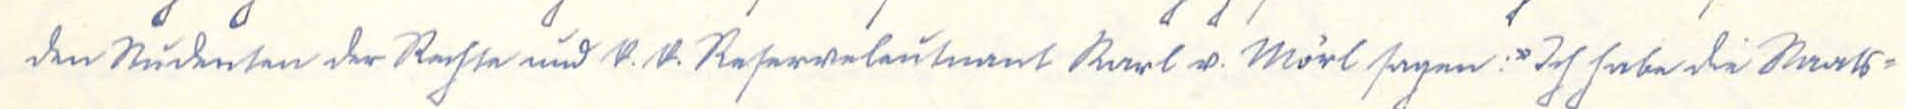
den Studenten der Rechte und k.k Reserveleutnant Karl v. Mörl sagen: "Ich habe die Staats-
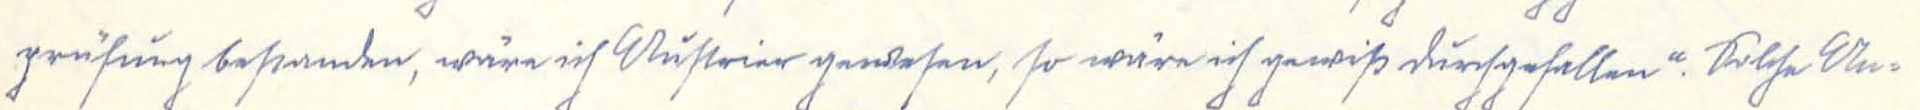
prüfung bestanden, wäre ich Austrier gewesen, so wäre ich gewiss durchgefallen." Solche An-
